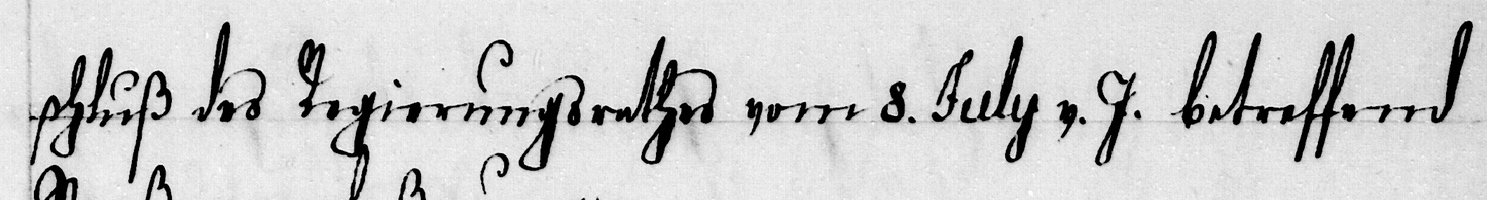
schluß des Regierungsrathes vom 8. July v. J. betreffend
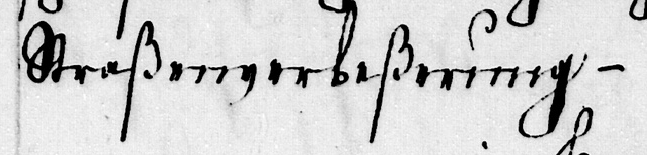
Straßenverbeßerung
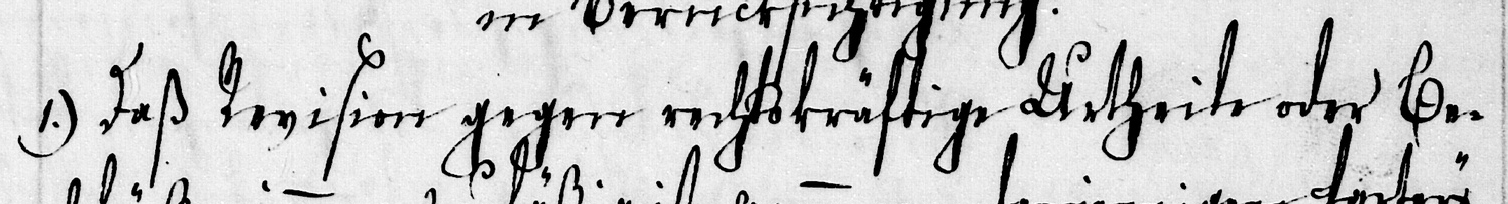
1.) Daß Revision gegen rechtskräftige Urtheile oder Be¬
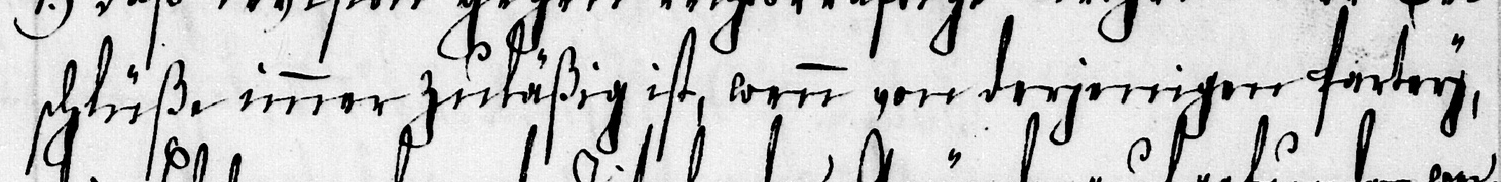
schlüße immer zuläßig ist, wenn von derjenigen Partey,
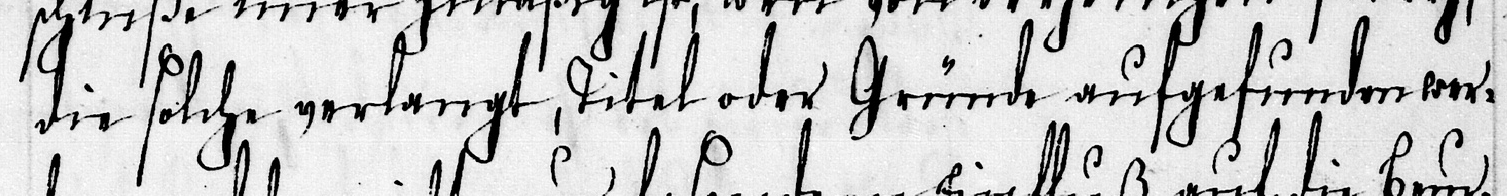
die solche verlangt, Titel oder Gründe aufgefunden wer¬
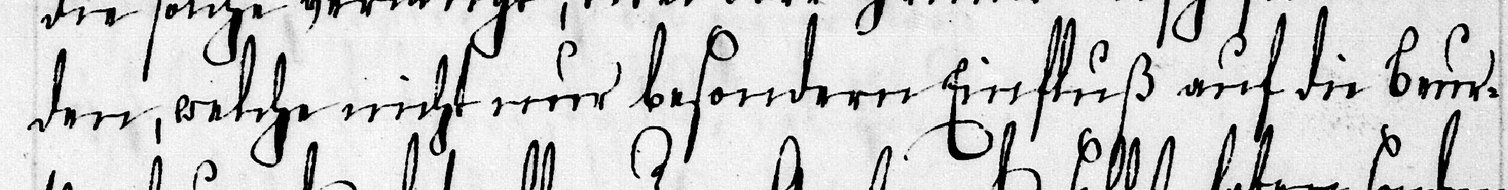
den, welche nicht nur besondern Einfluß auf die Beur¬
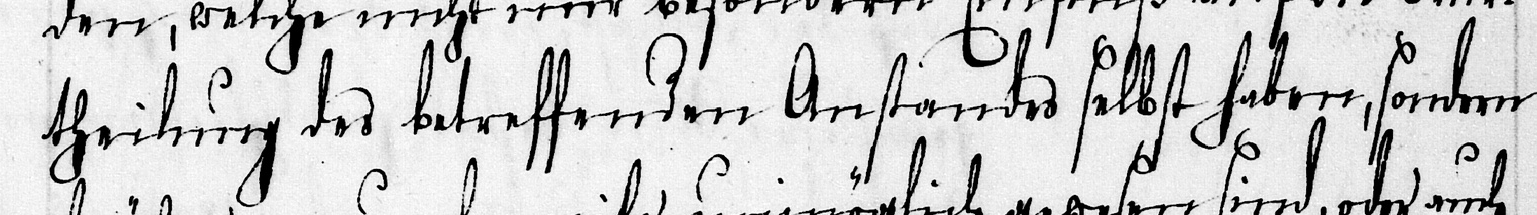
theilung des betreffenden Anstandes selbst haben, sondern
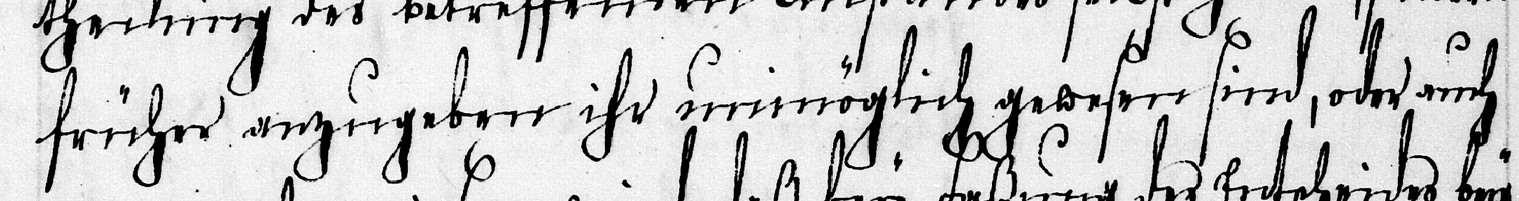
früher anzugeben ihr unmöglich gewesen sind, oder auch
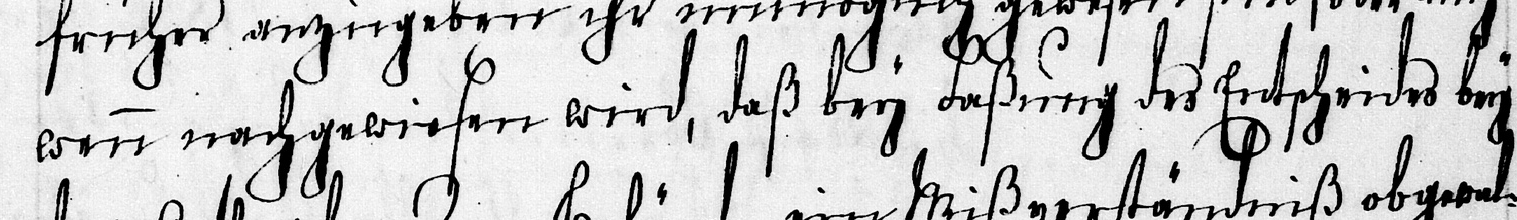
wenn nachgewiesen wird, daß bey Faßung des Entscheides bey
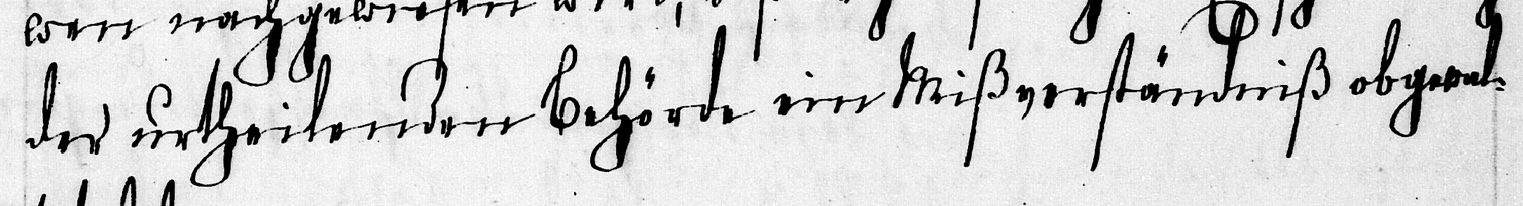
der urtheilenden Behörde ein Mißverständniß obgewal¬
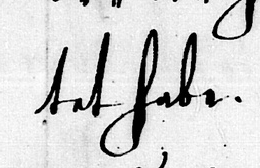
tet habe.
